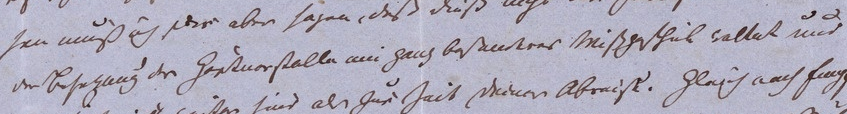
der Besetzung der Gärtnerstelle ein ganz besonderes Mißgeschick waltet und
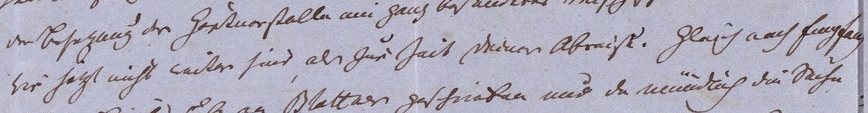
wir jetzt nicht weiter sind, als zur Zeit Deiner Abreise. Gleich nach Empfang
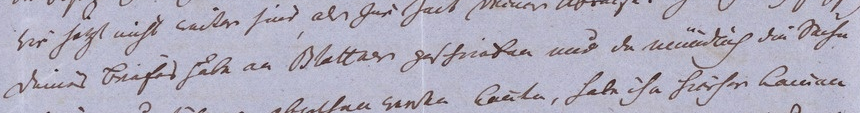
Deines Briefes habe an Blattner geschrieben und da mündlich die Sache
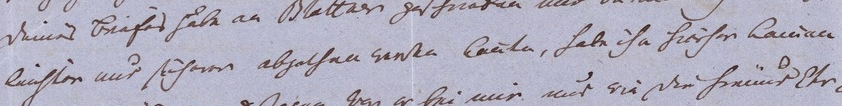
leichter und sicherer abgethan werden konnte, habe ihn hierher kommen
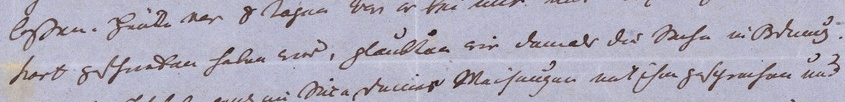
hart geschrieben haben wird, glaubten wir damals der Sache in Ordnung.
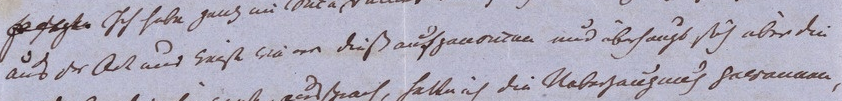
aus der Art und Weise wie er dieß aufgenommen und überhaupt sich über die
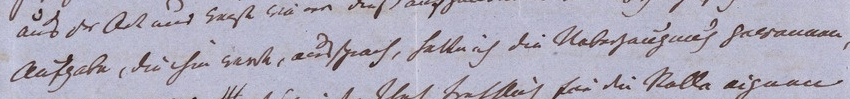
Aufgabe, die ihm werde, aussprach, hatte ich die Ueberzeugung gewonnen,
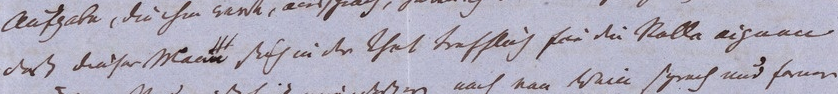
daß dieser Mann sich in der that trefflich für die Stelle eignen
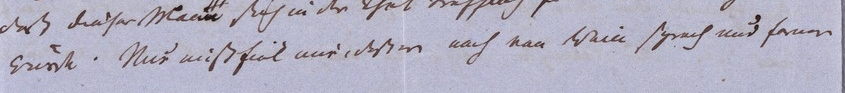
würde. Nur mißfiel mir, daß er noch von Wein sprach und ferner
